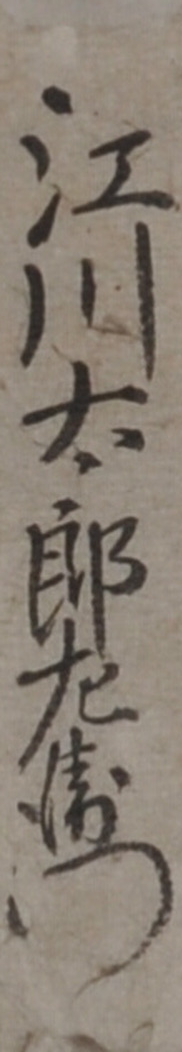江川太郎左衛門

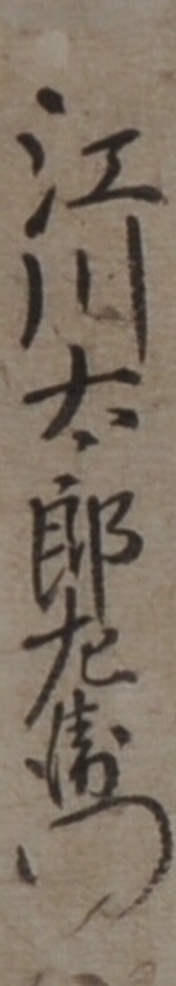江川太郎左衛門

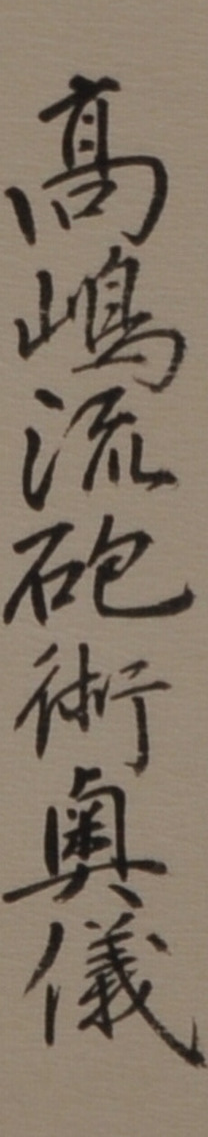高嶋流砲術奥義
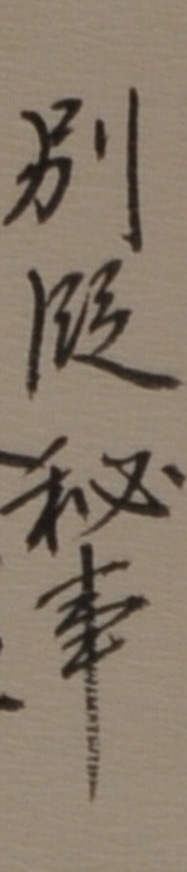別段秘事
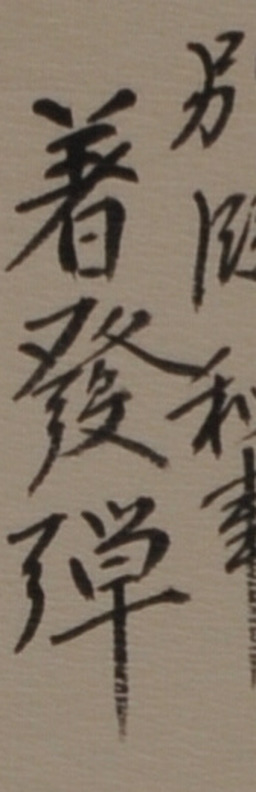着発弾
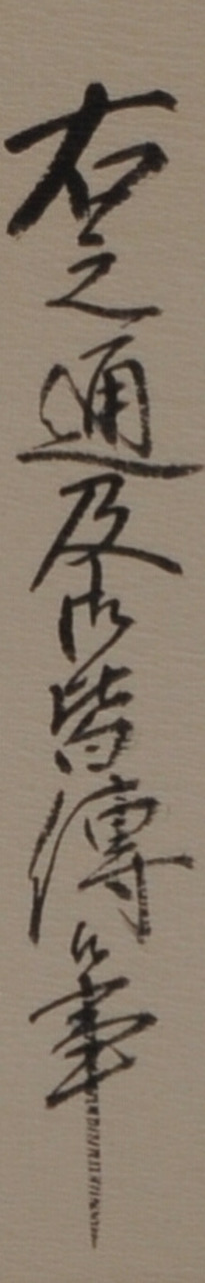右之通及御皆伝候事
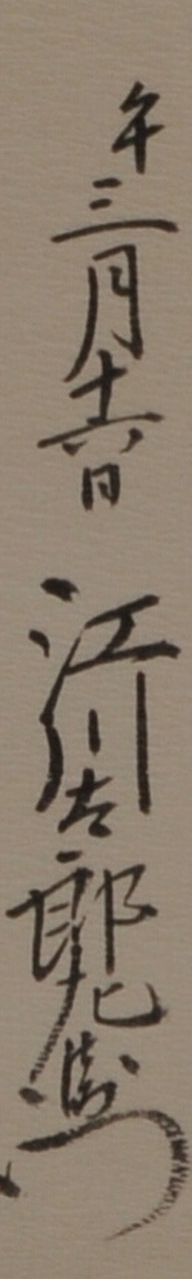午三月十六日江川太郎左衛門

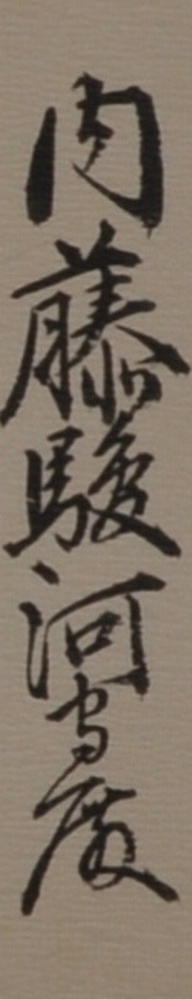内藤駿河守殿
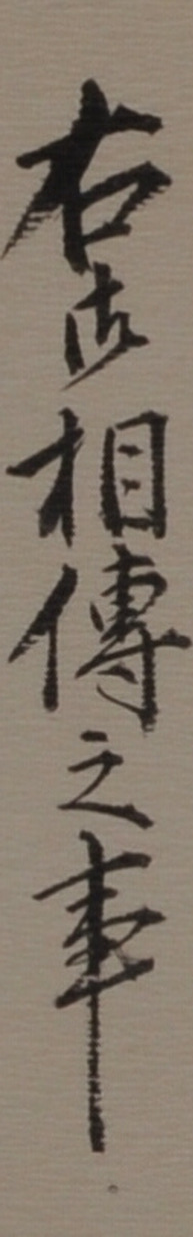右御相伝之事
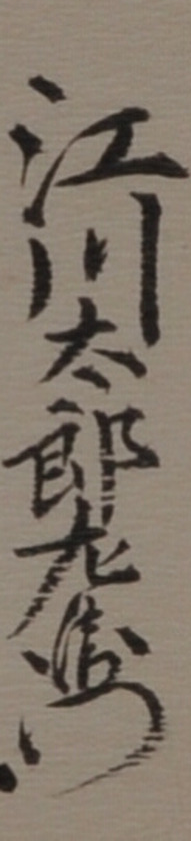江川太郎左衛門
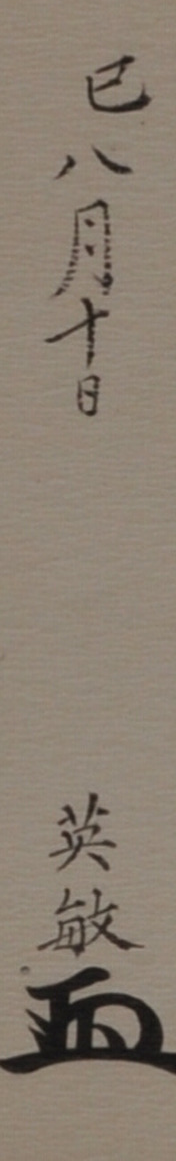巳八月十日英敏(花押)
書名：高島流砲術免許状
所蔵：伊那市立高遠町図書館・合同会社AMANE
